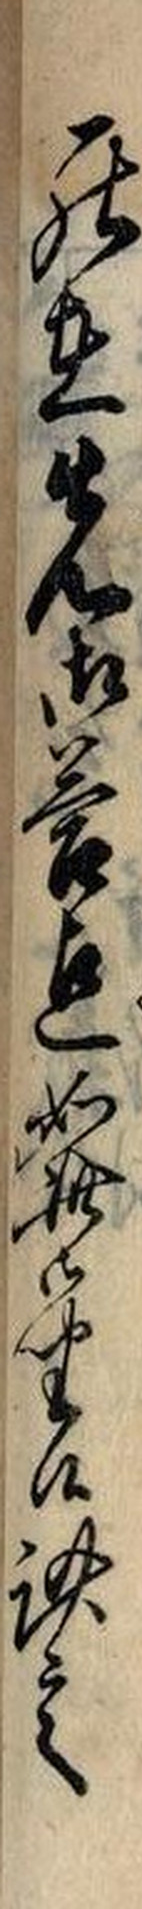罷在先御答迄如此御座候謹言
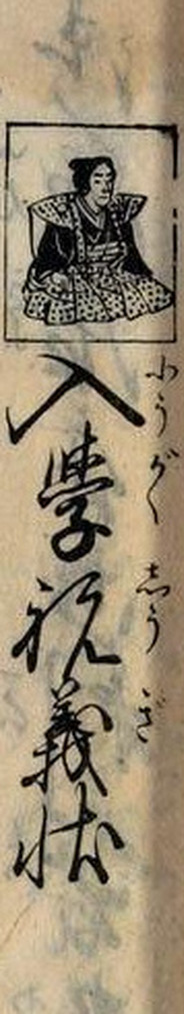入學祝義状
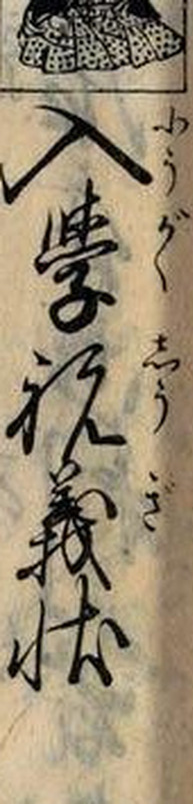入學祝義状
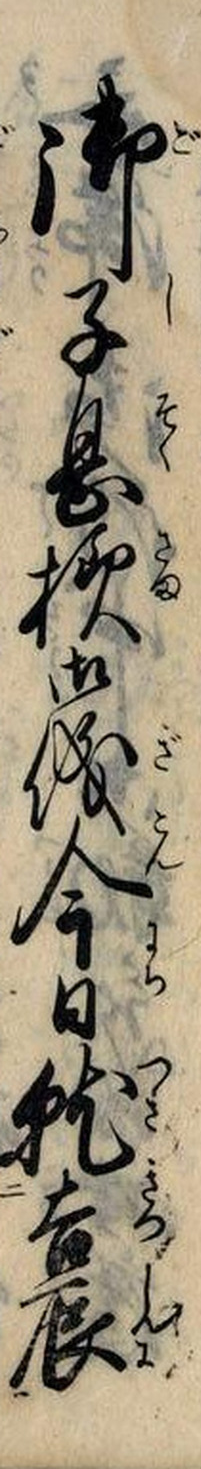御子息様御儀今日就吉辰
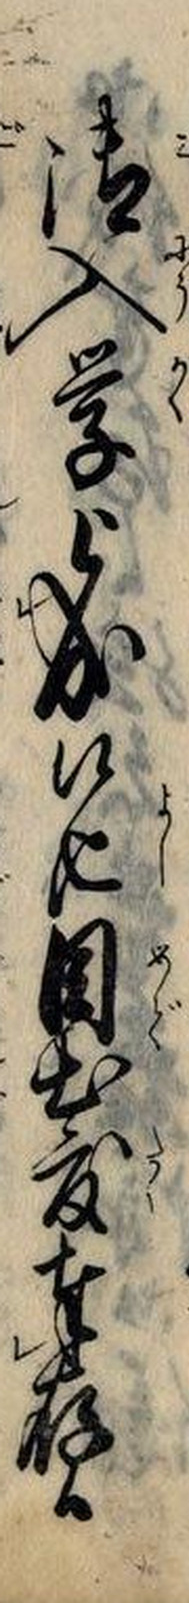御入学被成候由目出度奉存候
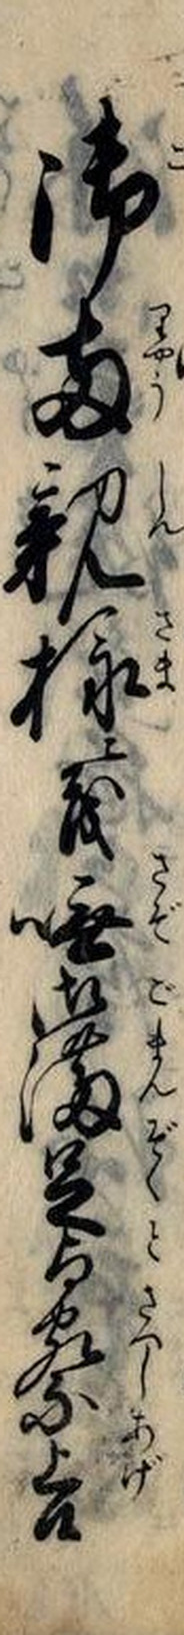御両親様にも嘸御満足与察上候
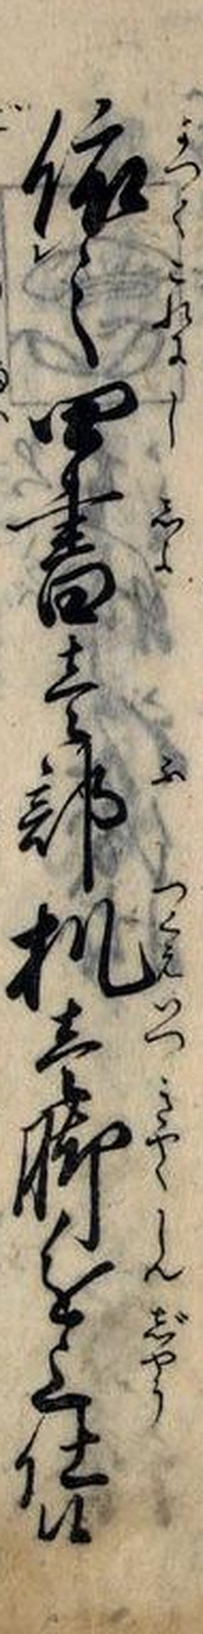依之四書壱部机壱脚進上仕候

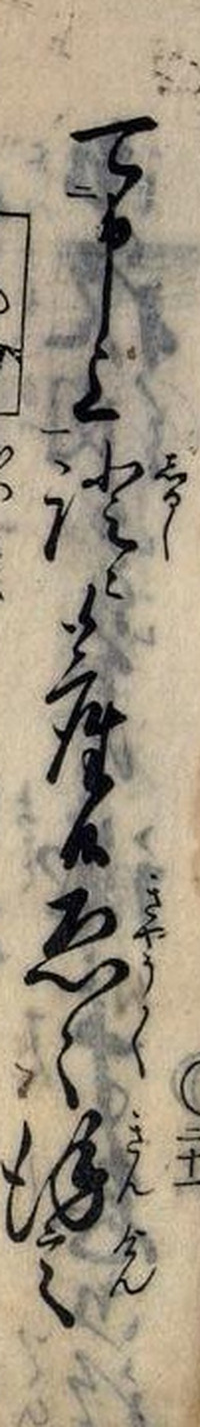可申上證に御座候恐々謹言
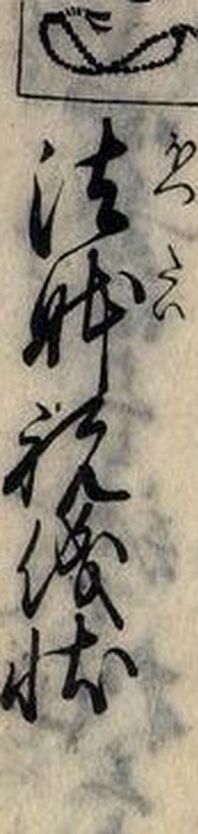法躰祝儀状
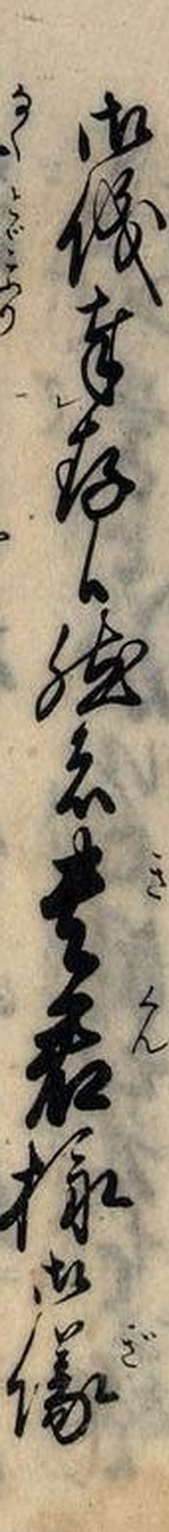御儀奉存候然者貴君様御儀
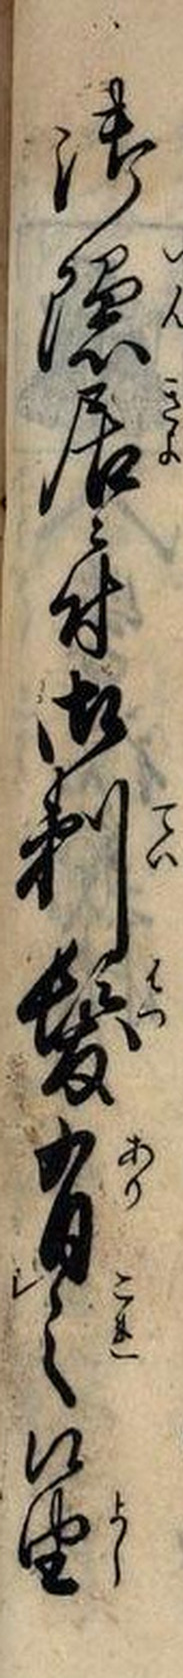御隠居に付御剃髪有之候由
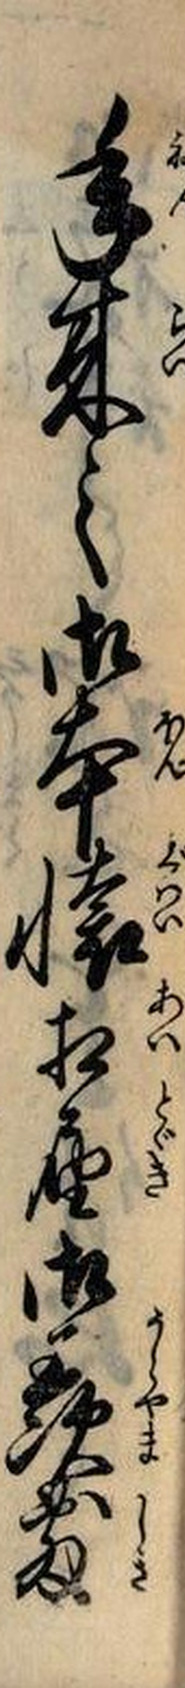年来之御本懐相届御羨敷
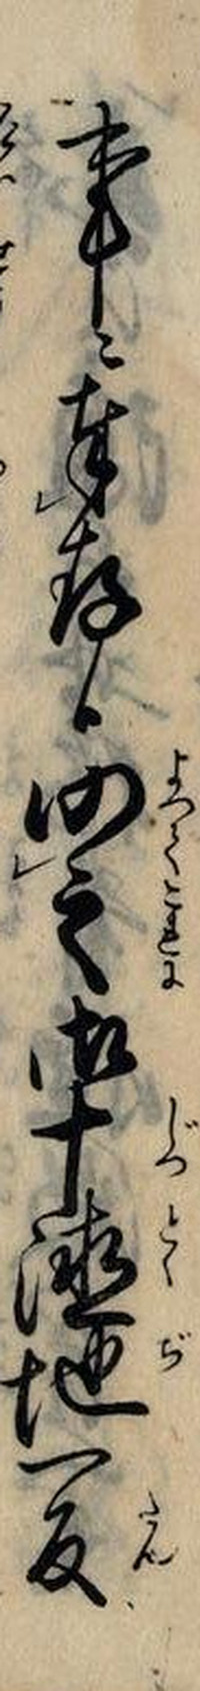事に奉存候仍之御十徳地一反
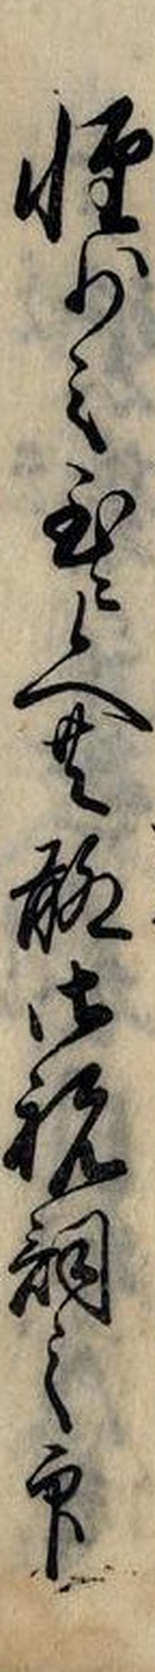軽少之至に候ヘ共聊御祝詞之印
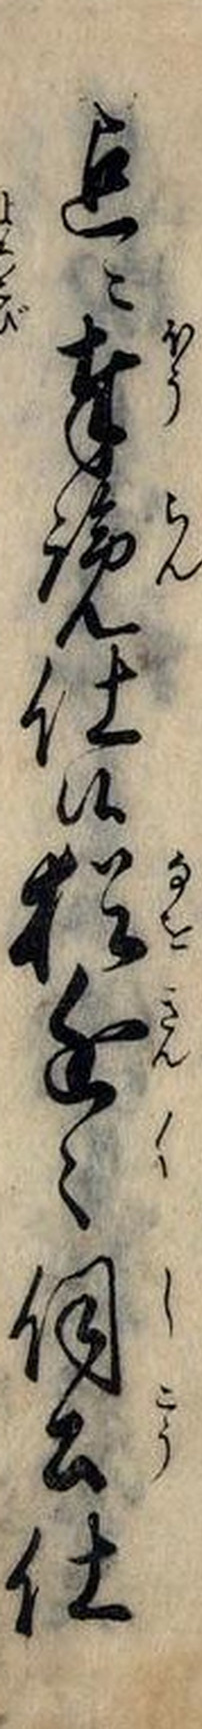迄に奉覧仕候猶近々伺公仕
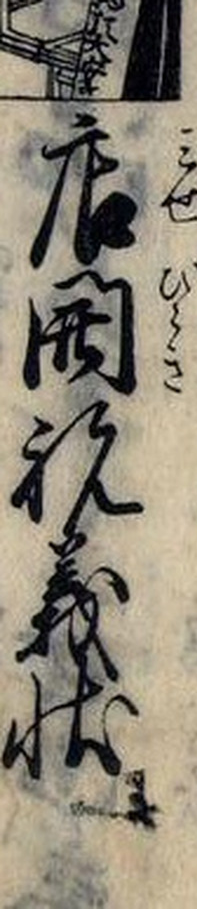店開祝義状
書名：大成用文章（往来物）
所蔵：福井県文書館 Fukui Prefectural Archives
